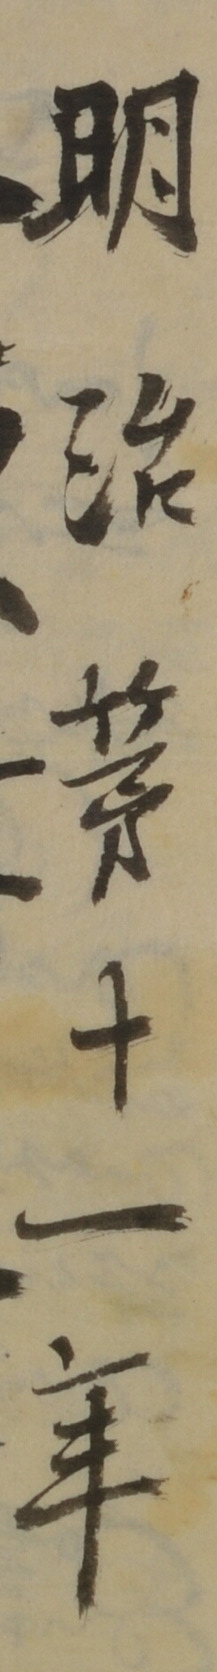明治第十一年
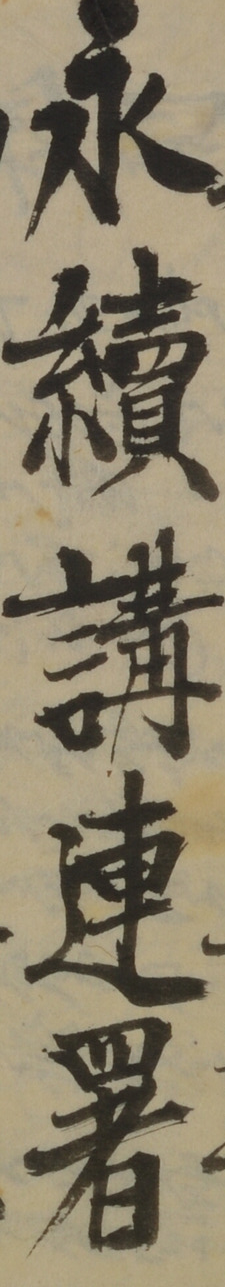永続講連署
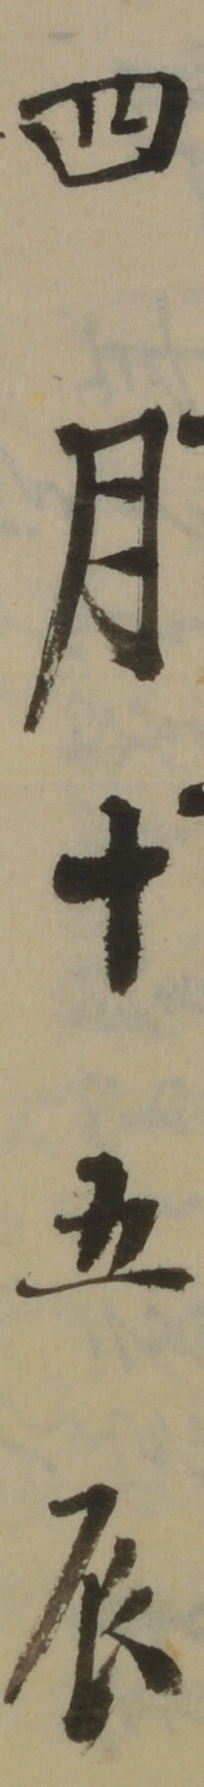四月十五辰

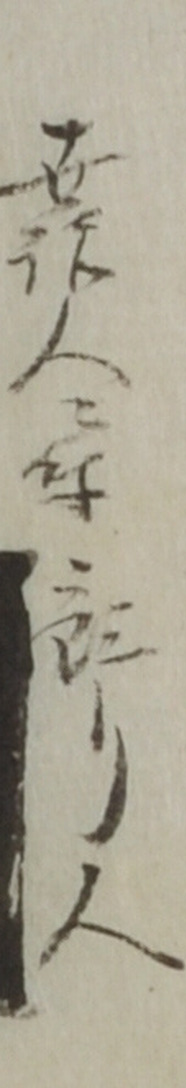世話人ニ付預り人
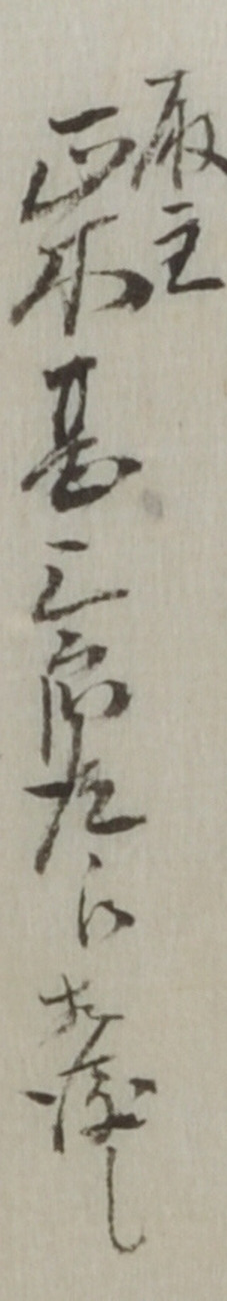正木甚三郎殿江相渡し
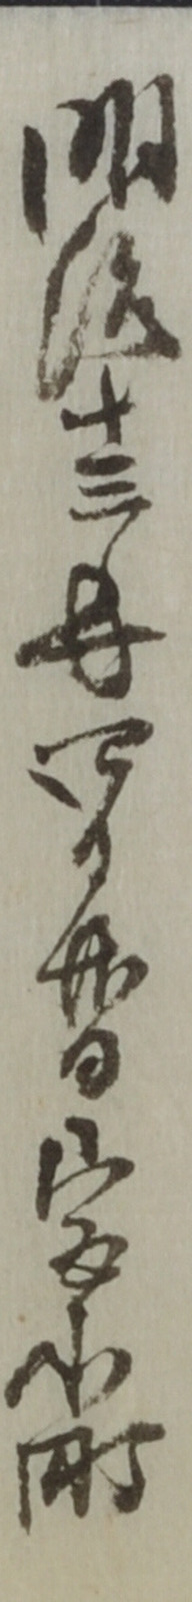明治十三年四月廿日宮木町
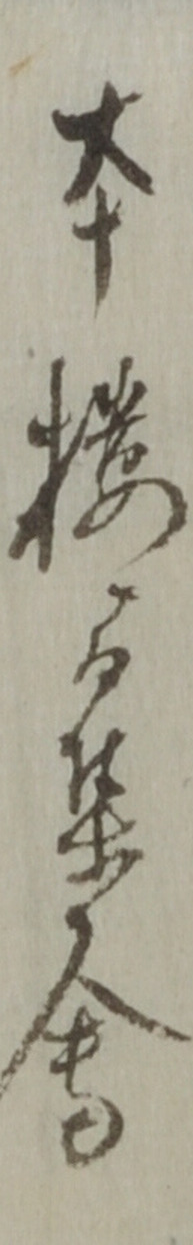本楼ニ而集会
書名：永続講連署
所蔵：伊那市立高遠町図書館・合同会社AMANE
